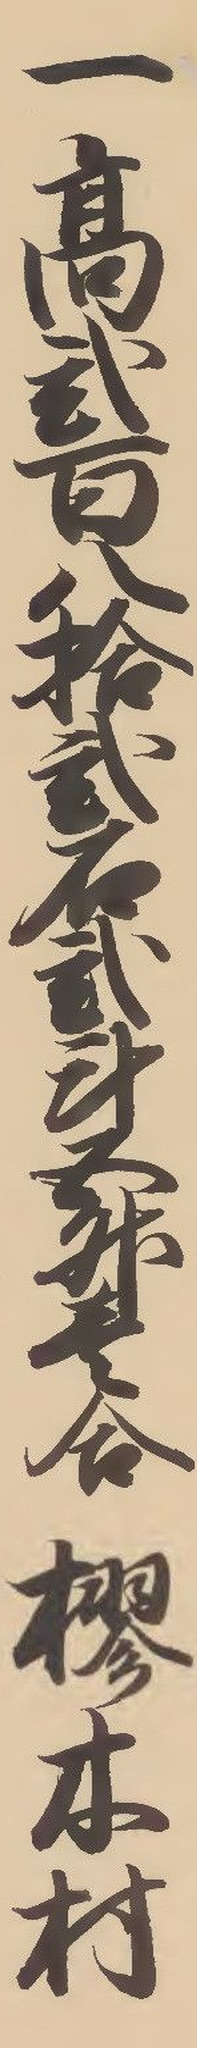一高弐百八拾弐石弐斗五升壱合樛木村
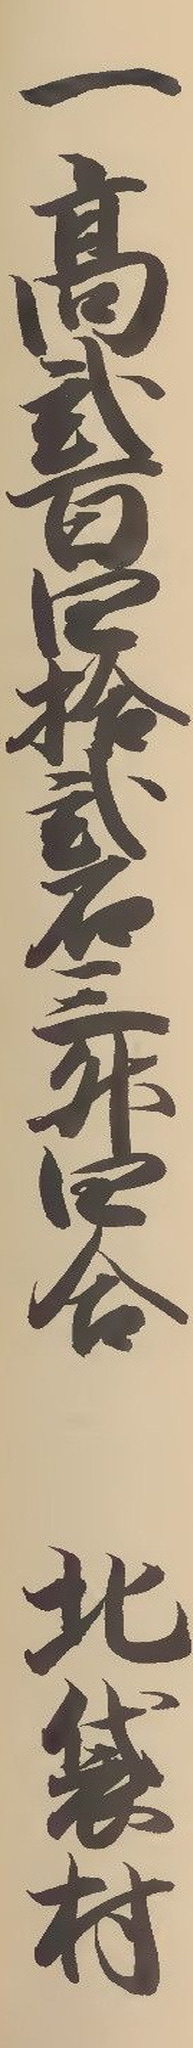一高弐百四拾弐石三升四合北袋村
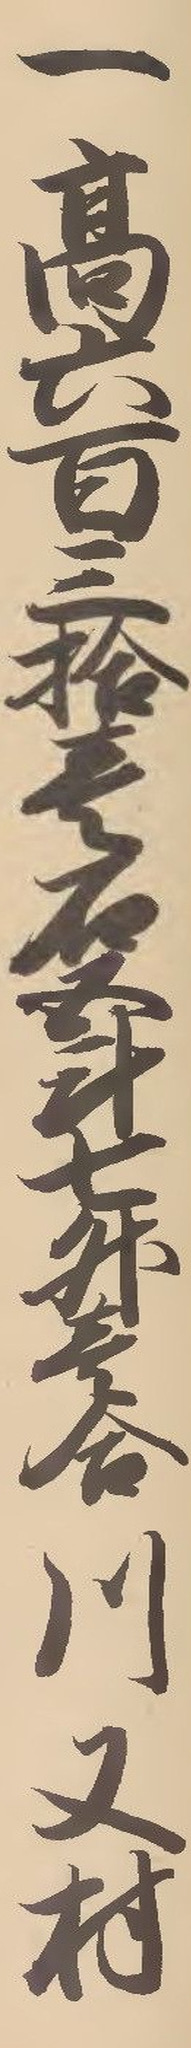一高六百三拾壱石五斗七升壱合川又村
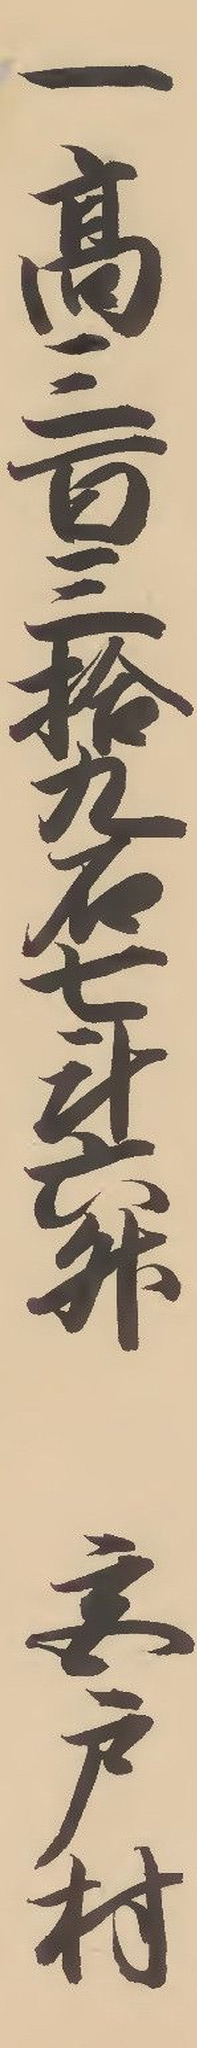一高三百三拾九石七斗六升宮戸村
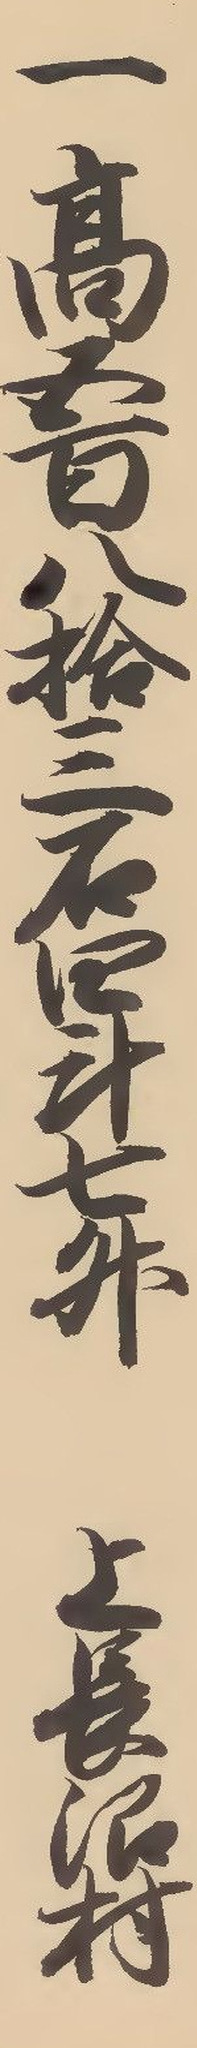一高五百八拾三石四斗七升上長沼村
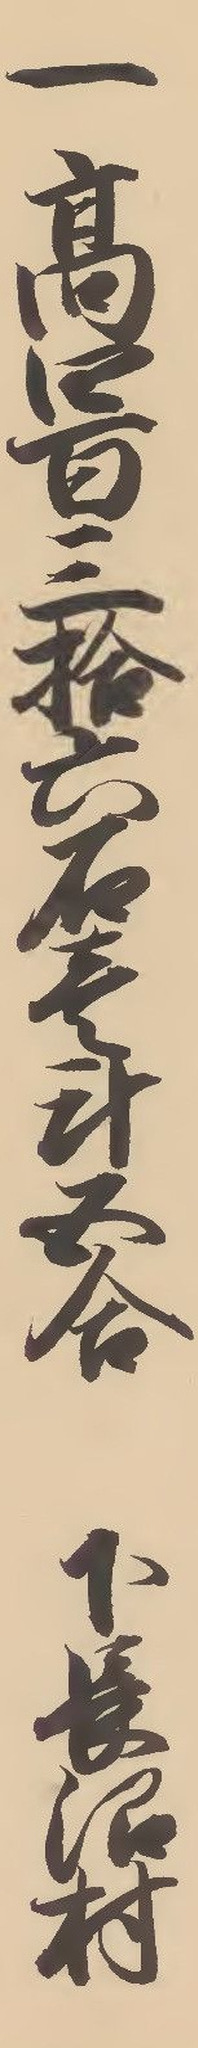一高四百三拾六石壱斗五合下長沼村

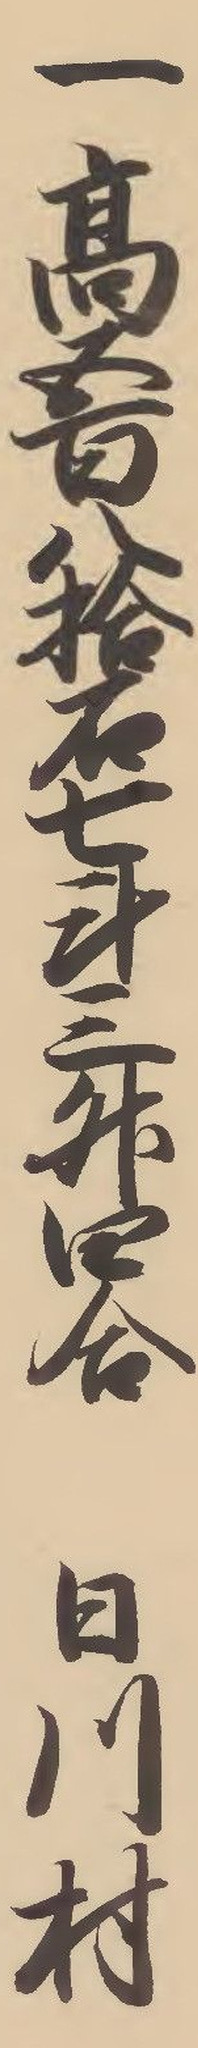一高五百八拾石七斗三升四合日川村
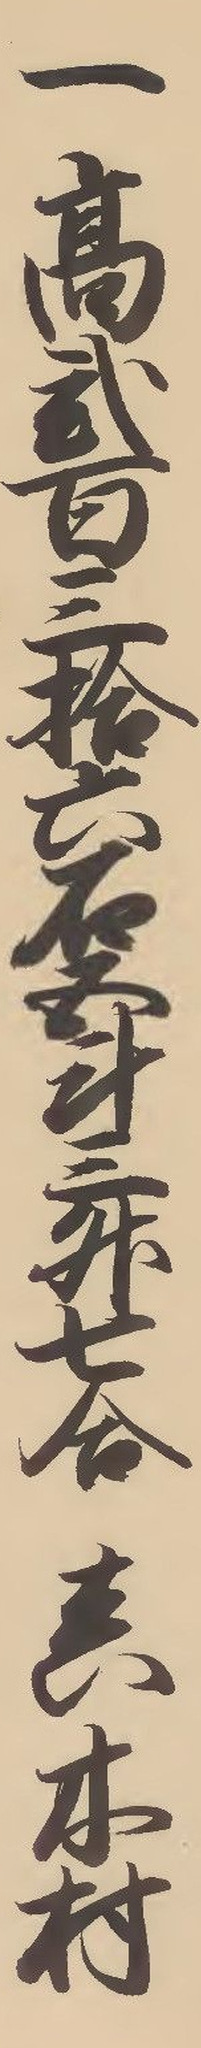一高弐百三拾六石五斗三升七合真木村
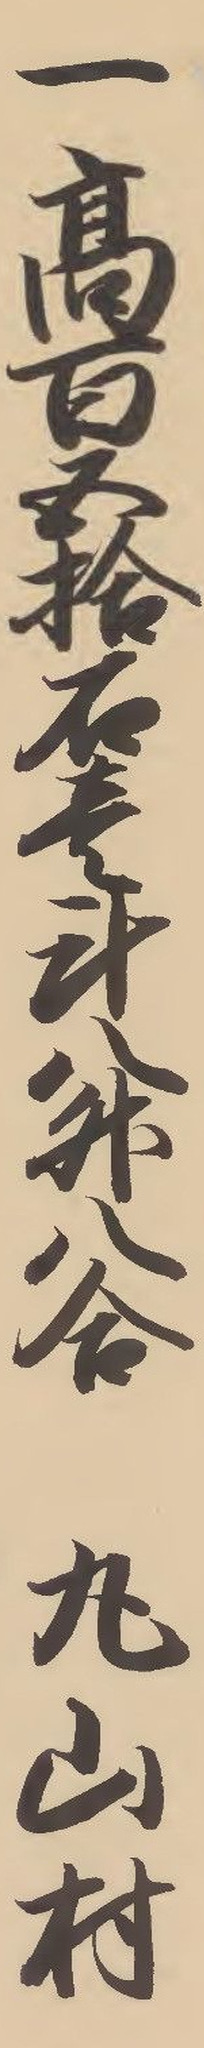一高百五拾石壱斗八升八合丸山村
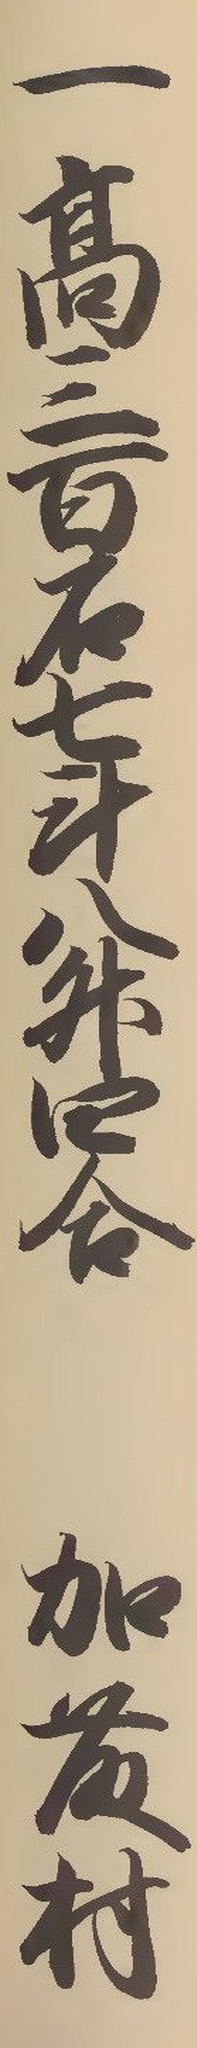一高三百石七斗八升四合加藤村
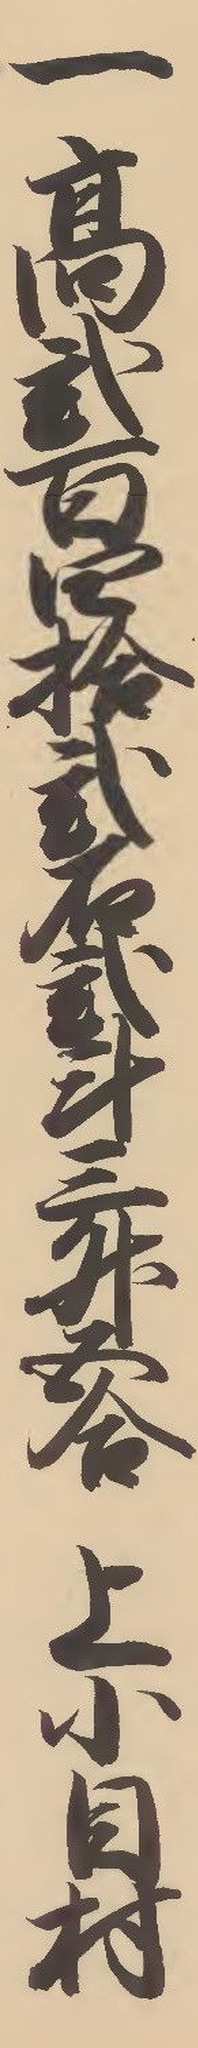一高弐百四拾弐石弐斗三升五合上小目村
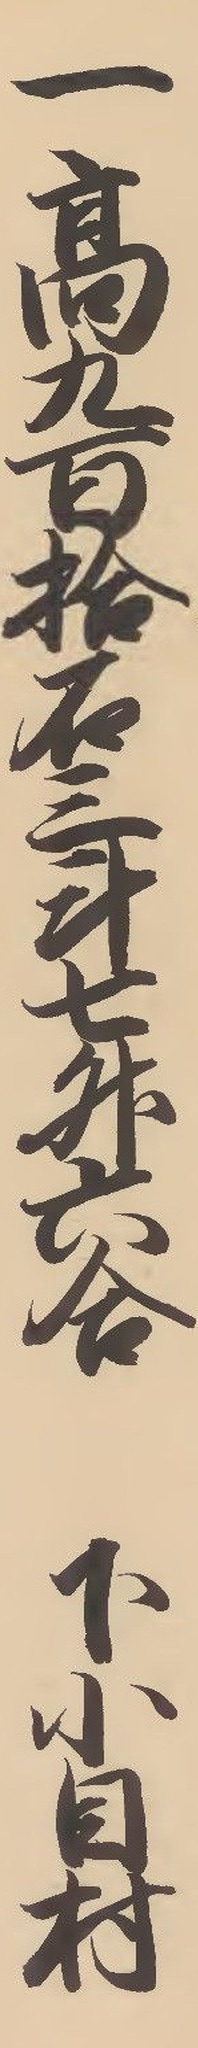一高九百拾石三斗七升六合下小目村
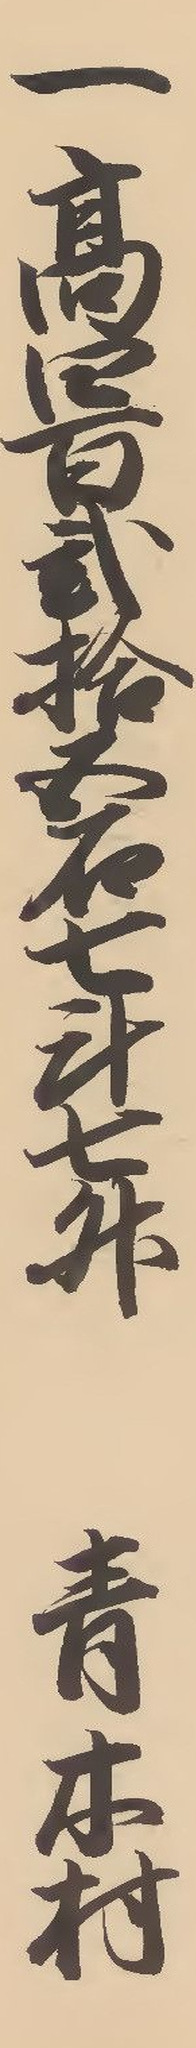一高四百弐拾五石七斗七升青木村

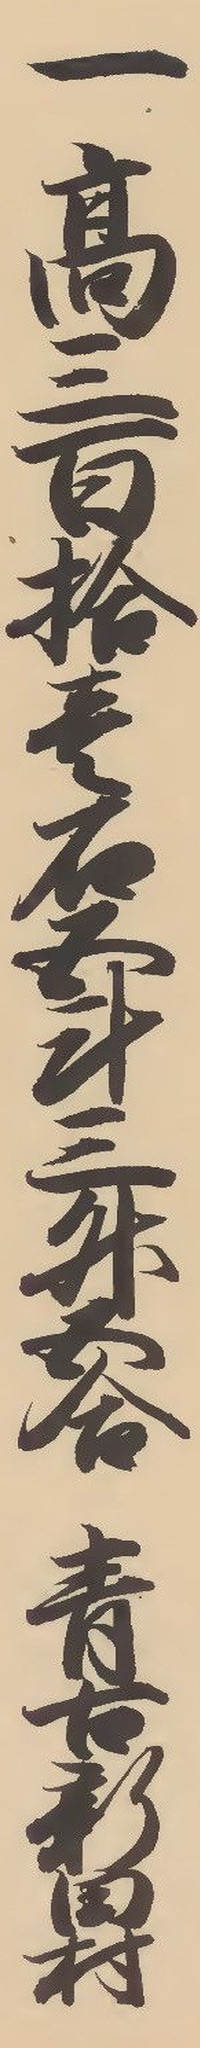一高三百拾壱石五斗三升五合青古新田村
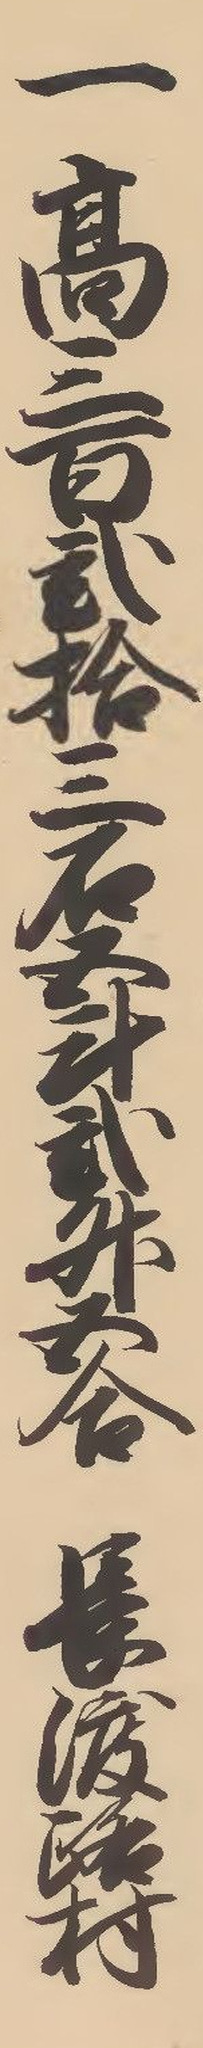一高三百弐拾三石五斗弐升五合長渡路村
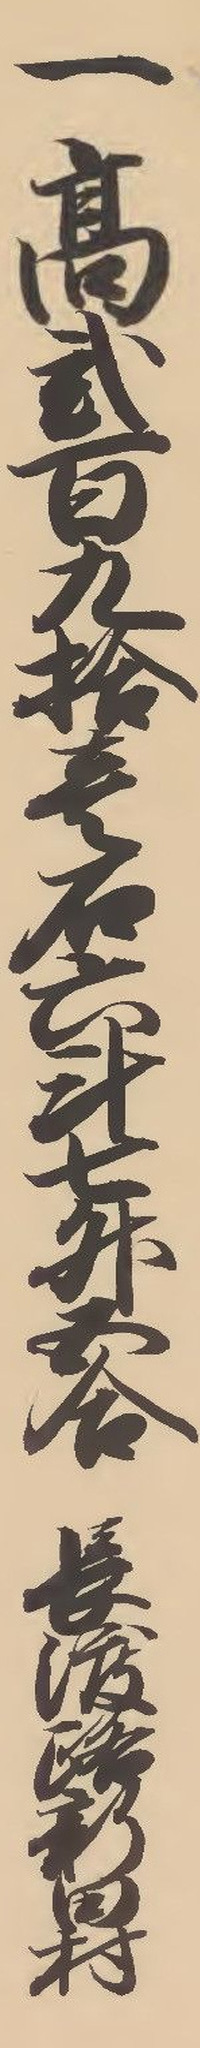一高弐百九拾壱石六斗七升五合長渡路新田村
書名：常陸国郷帳
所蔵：国立公文書館 National Archives of Japan
